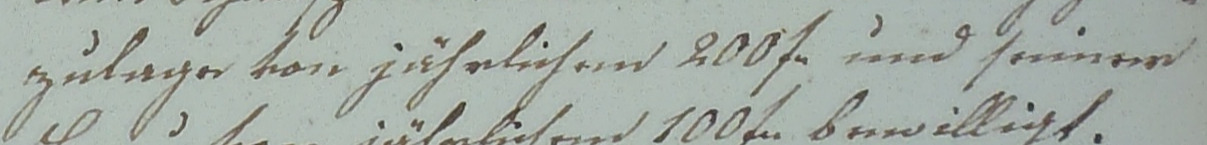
zulage von jährlichen 200fn und seiner
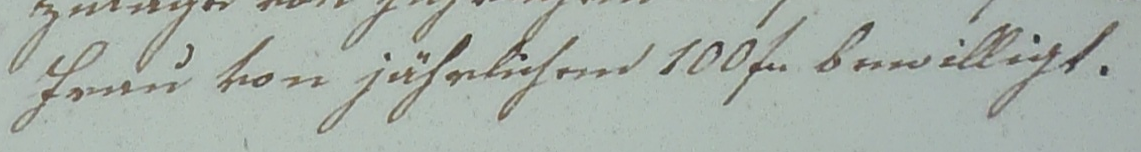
Frau von jährlichen 100fn bewilligt.
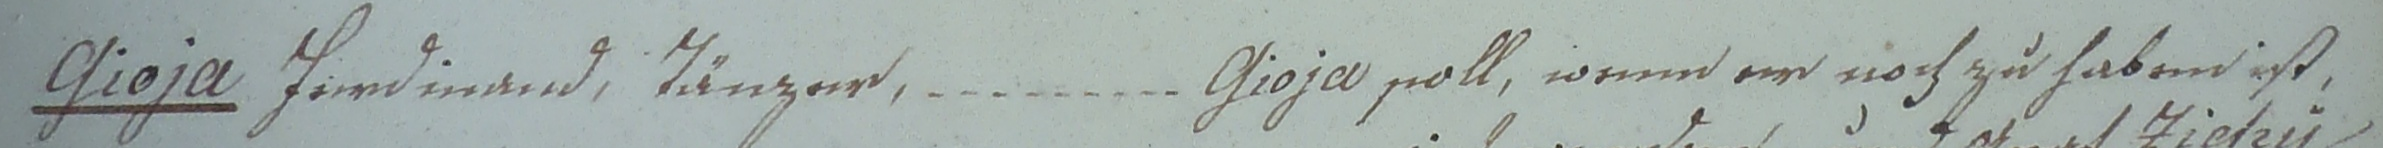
Gioja Ferdinand, Tänzer, ……… Gioja soll, wenn er noch zu haben ist,
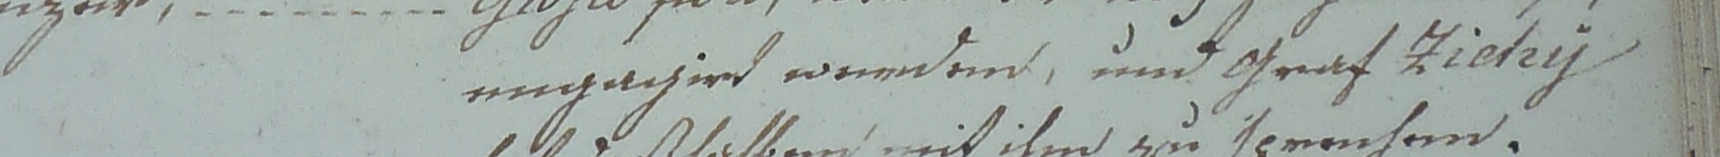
engagird werden, und Graf Zichy
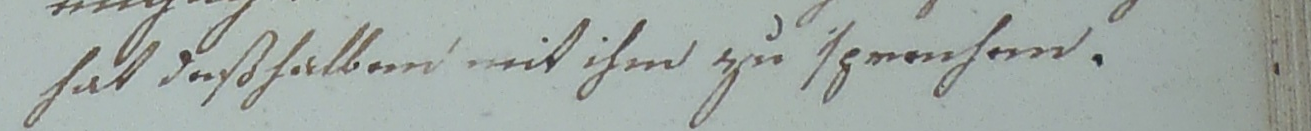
hat deßhalben mit ihm zu sprechen.
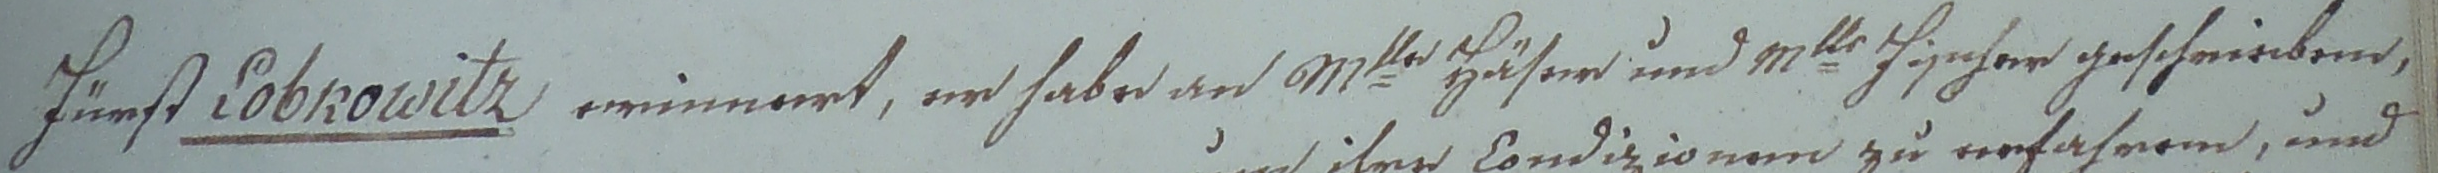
Fürst Lobkowitz erinnert, er habe an Mll͇e Häser und Mll͇e Fischer geschrieben,
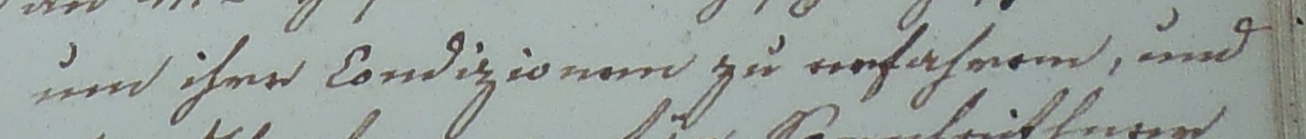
um ihre Condizionen zu erfahren, und
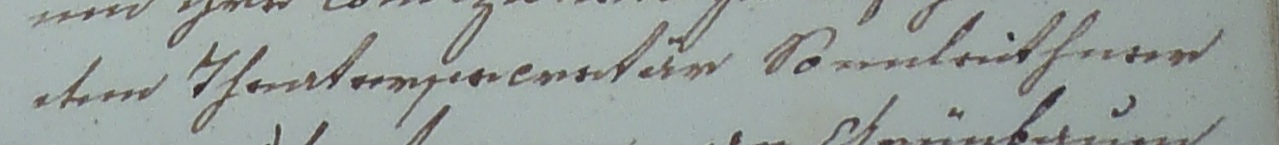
dem Theatersecretär Sonnleithner
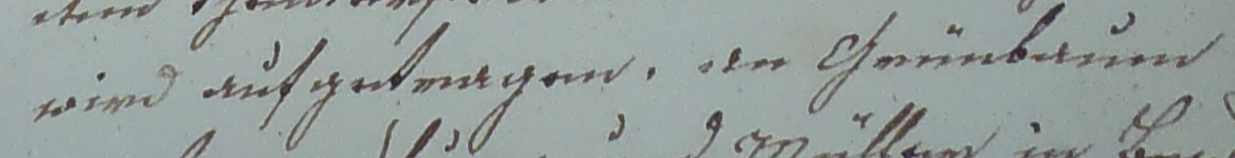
wird aufgetragen, an Grünbaum
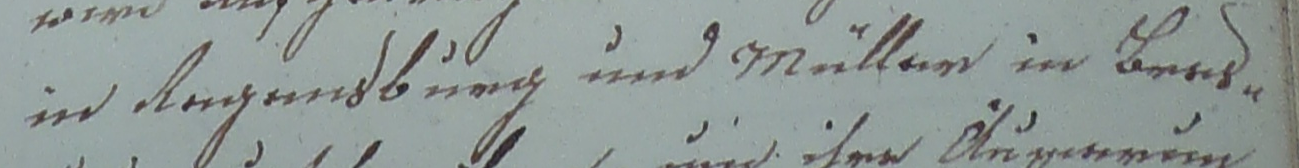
in Regensburg und Müller in Bres¬
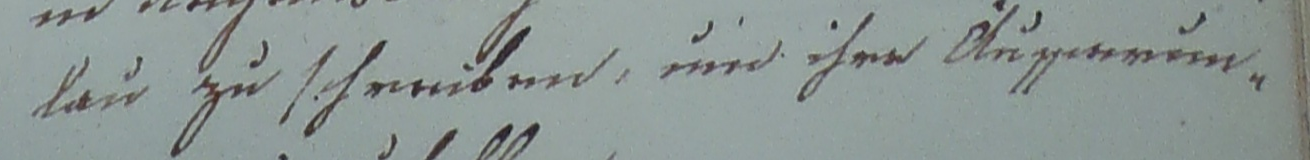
lau zu schreiben, um ihre Äusserrun¬
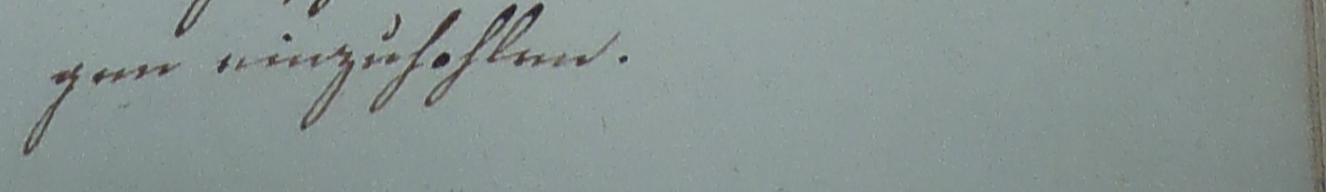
gen einzuhohlen.
